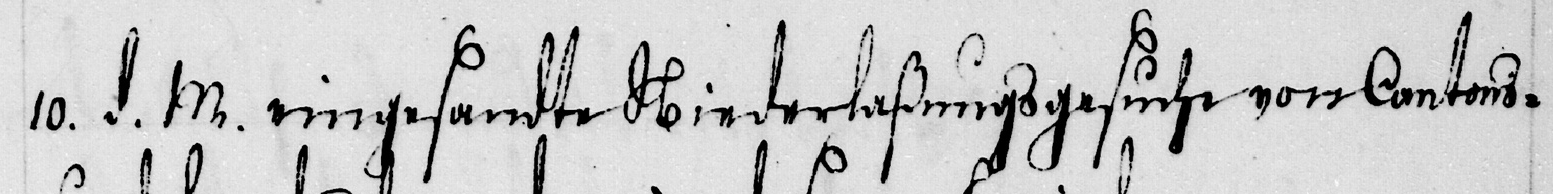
10. d. M. eingesandte Niederlaßungsgesuche von Cantons-
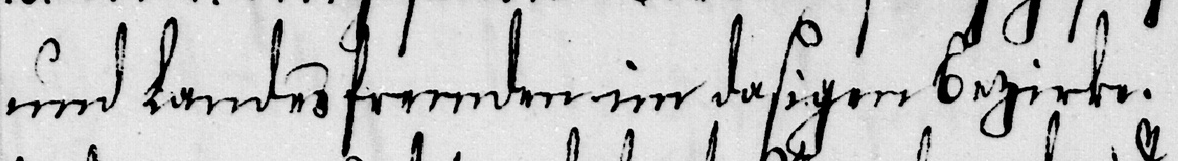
und Landesfremden im dasigen Bezirke.
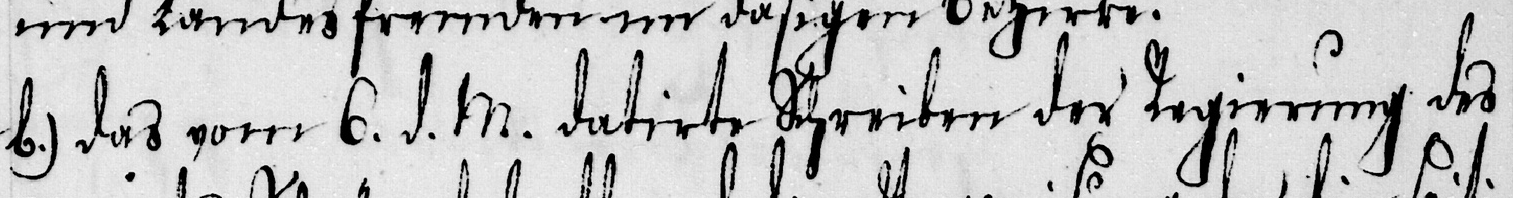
b.) das vom 6. d. M. datirte Schreiben der Regierung des
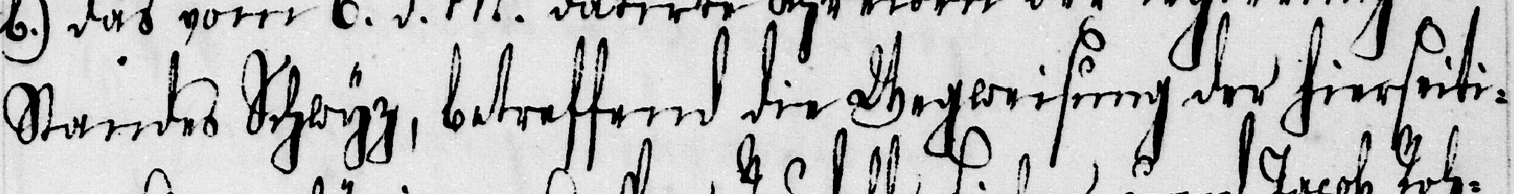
Standes Schwyz, betreffend die Wegweisung der hierseiti¬
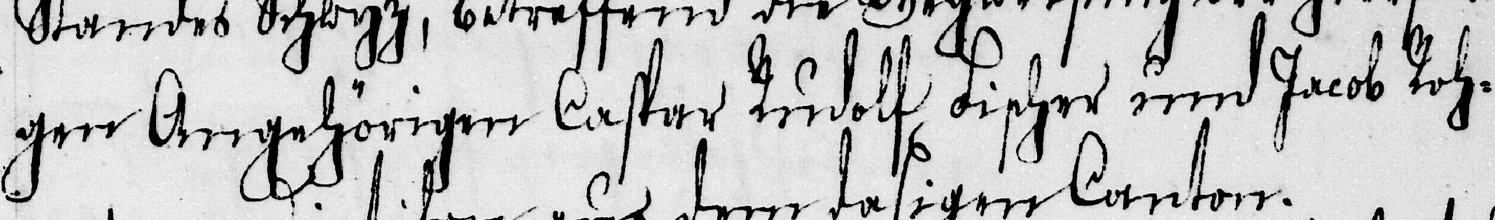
gen Angehörigen Caspar Rudolf Fischer und Jacob Roh¬
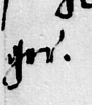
bes¬
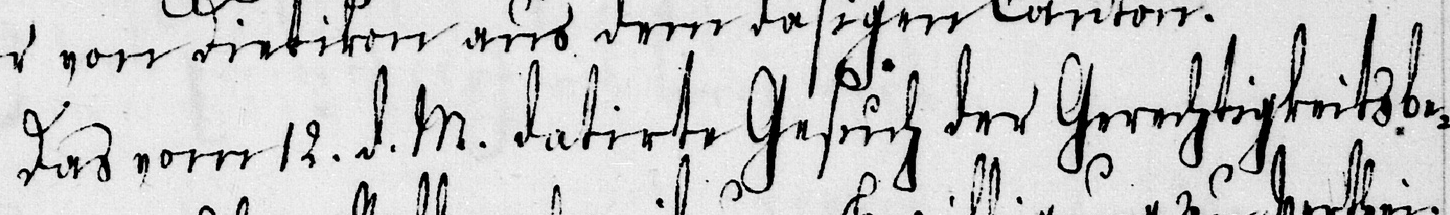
Das vom 12. d. M. datirte Gesuch der Gerechtigkeits¬
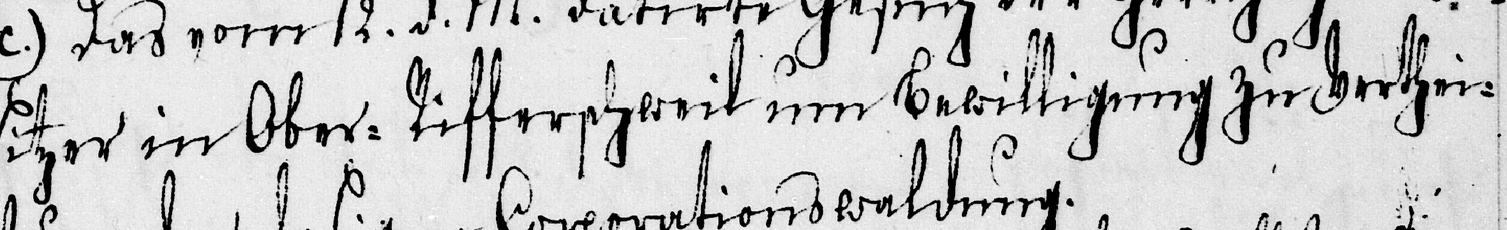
itzer in Ober-Rifferschweil um Bewilligung zu Verthei¬
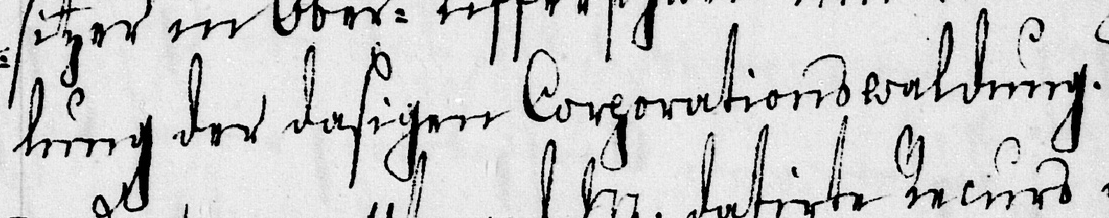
lung der dasigen Corporationswaldung.
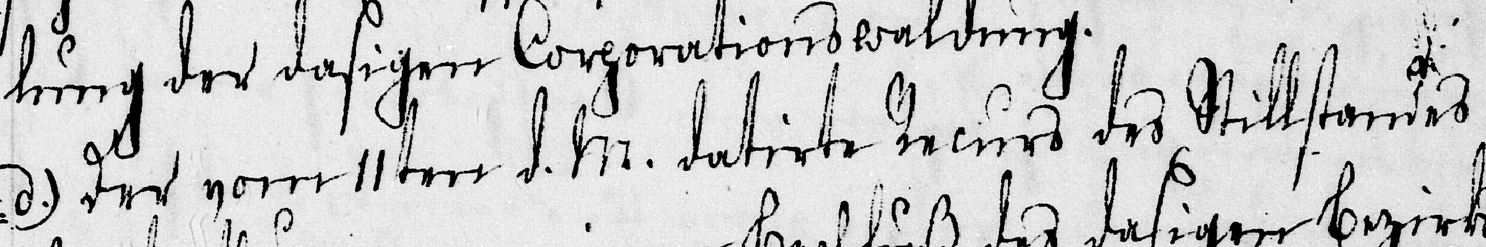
d.) Der vom 11ten d. M. datirte Recurs des Stillstandes
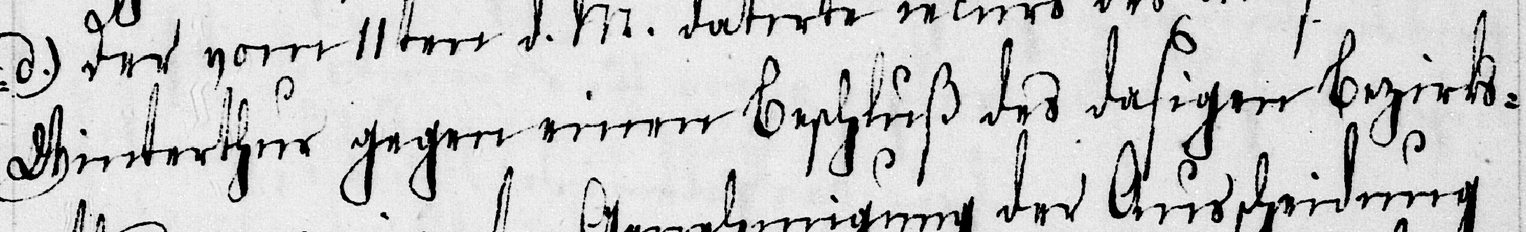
Winterthur gegen einen Beschluß des dasigen Bezirks¬
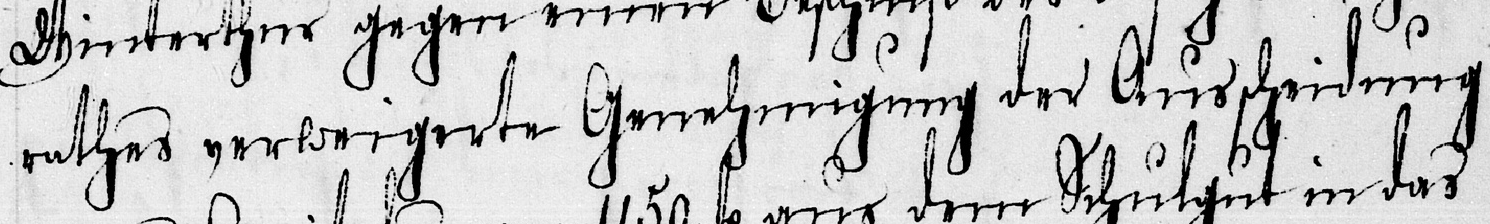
rathes verweigerte Genehmigung der Ausscheidung
